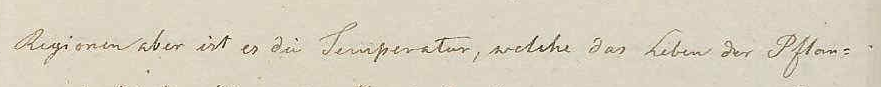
Regionen aber ist es die Temperatur, welche das Leben der Pflan-
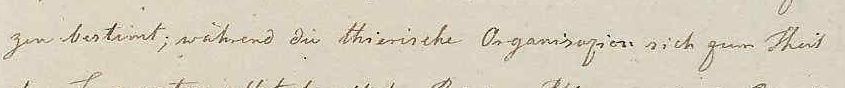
zen bestimt; während die thierische Organisazion sich zum Theil
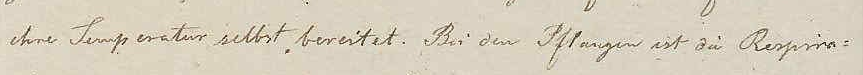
ihre Temperatur selbst bereitet. Bei den Pflanzen ist die Respira-
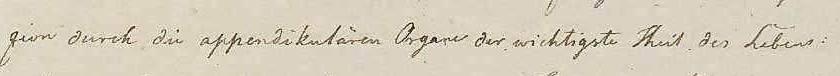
zion durch die appendikulären Organe der wichtigste Theil des Lebens:
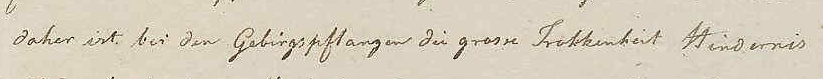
daher ist bei den Gebirgspflanzen die grosse Trokkenheit Hindernis
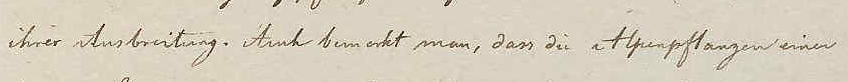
ihrer Ausbreitung. Auch bemerkt man, dass die Alpenpflanzen einen
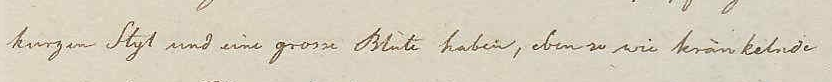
kurzen Styl und eine grosse Blüte haben, eben so wie kränkelnde
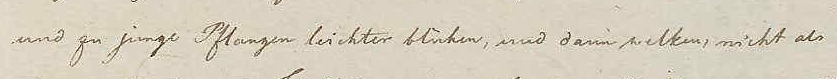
und zu junge Pflanzen leichter blühen, und dann welken, nicht als
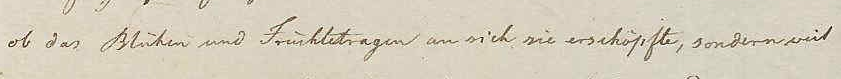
ob das Blühen und Früchtetragen an sich sie erschöpfte, sondern weil
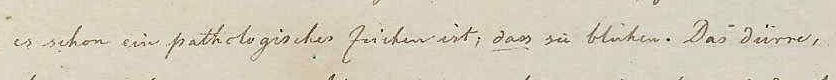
es schon ein pathologisches Zeichen ist dass sie blühen. Das dürre,
